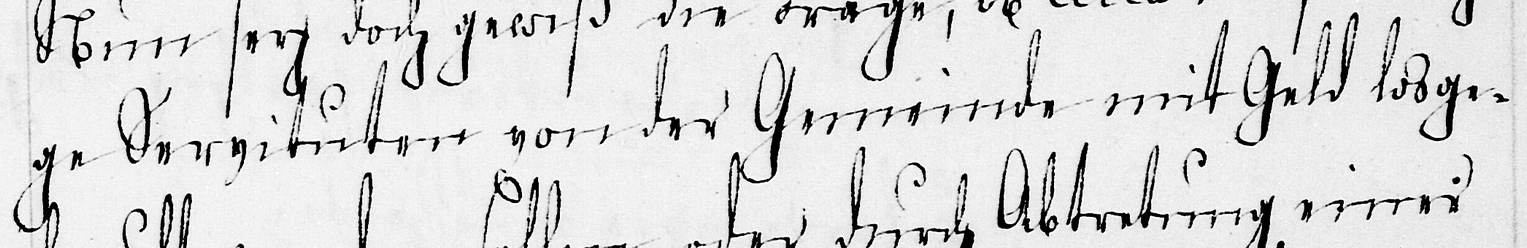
ge Servituten von der Gemeinde mit Geld losge¬
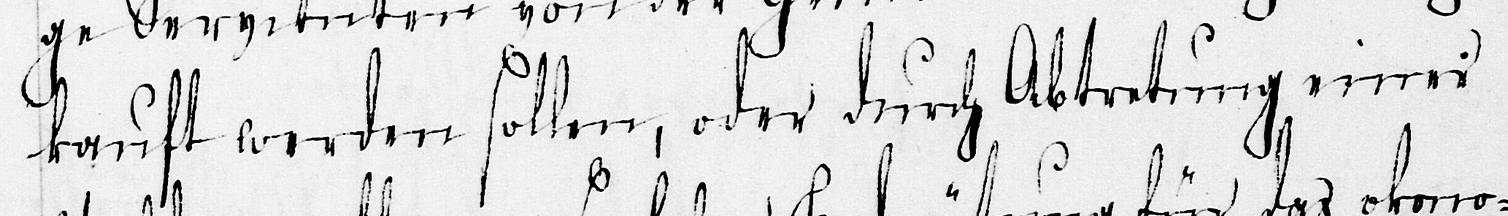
kauft werden sollen, oder durch Abtretung einer
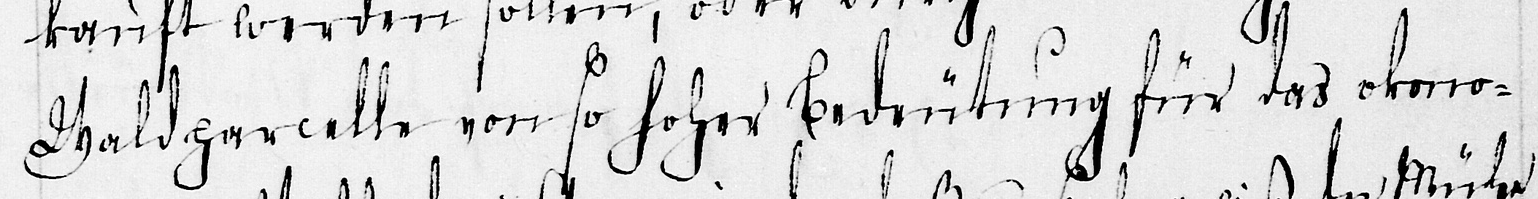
Waldparcelle von so hoher Bedeutung für das okono¬
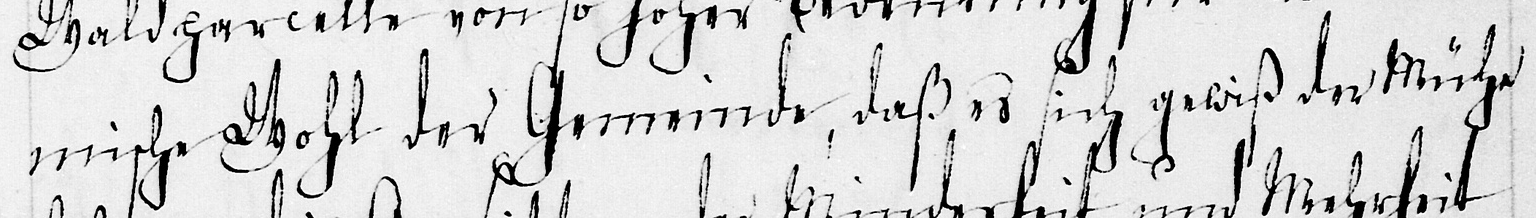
mische Wohl der Gemeinde, daß es sich gewiß der Mühe
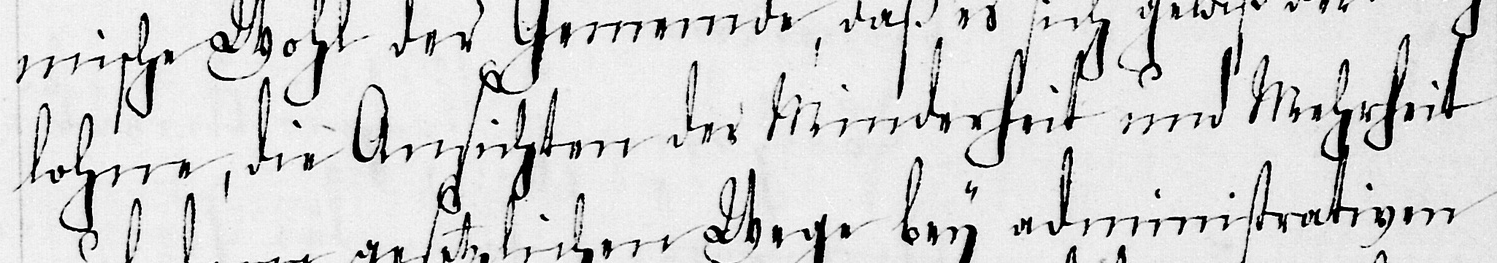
lohne, die Ansichten der Minderheit und Mehrheit
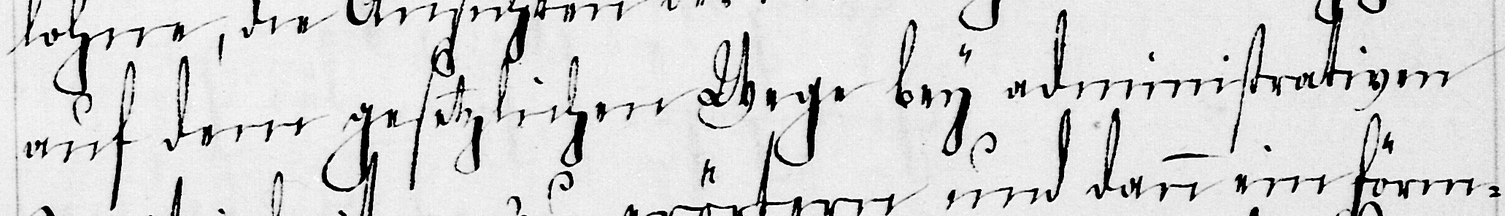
auf dem gesetzlichen Wege bey administrativen
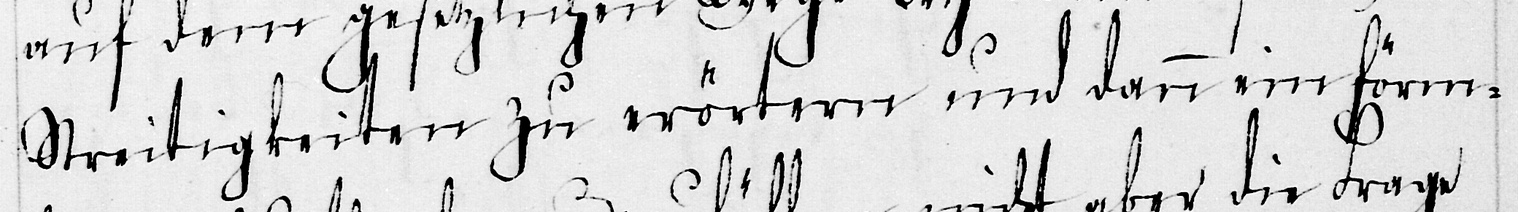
Streitigkeiten zu erörtern und dann ein förm¬
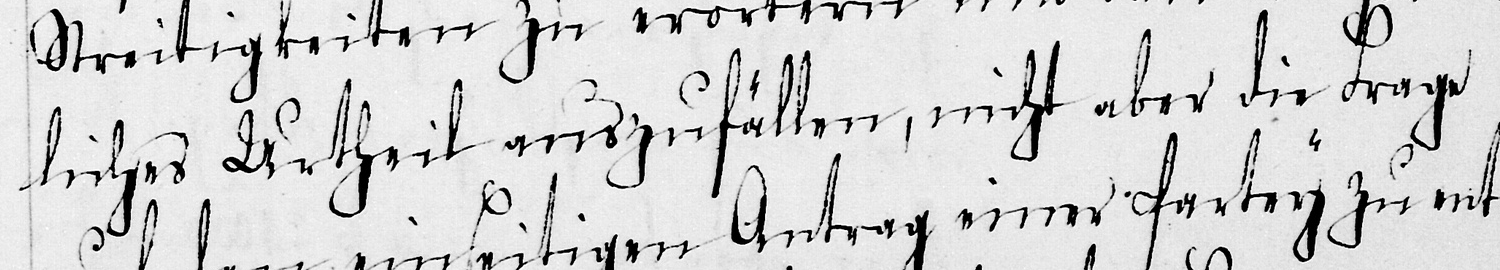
liches Urtheil auszufällen, nicht aber die Frage
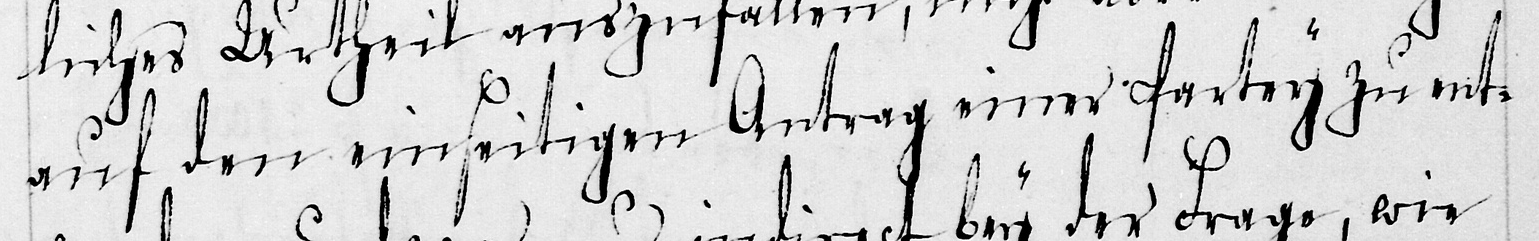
auf den einseitigen Antrag einer Partey zu ent¬
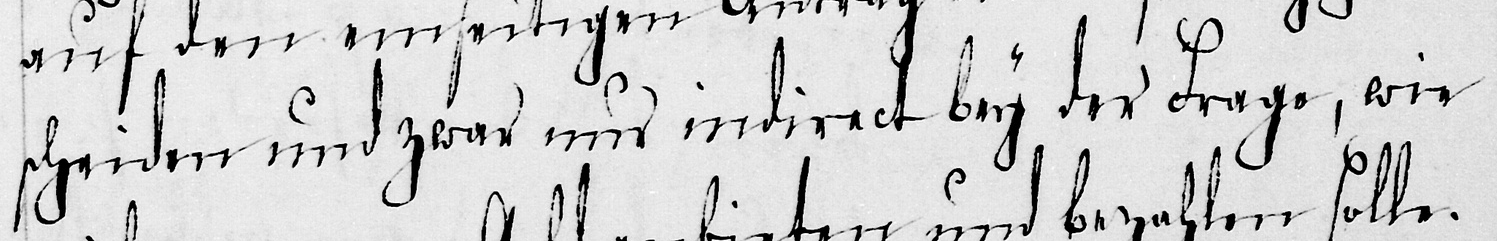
scheiden und zwar nur indirect bey der Frage, wie
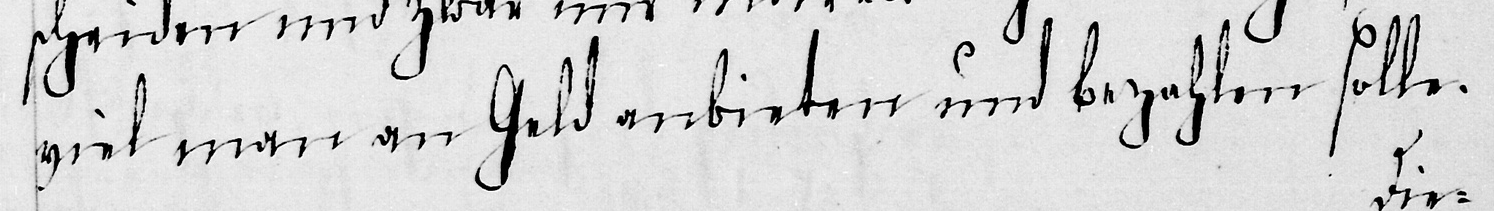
viel man an Geld anbieten und bezahlen solle.
